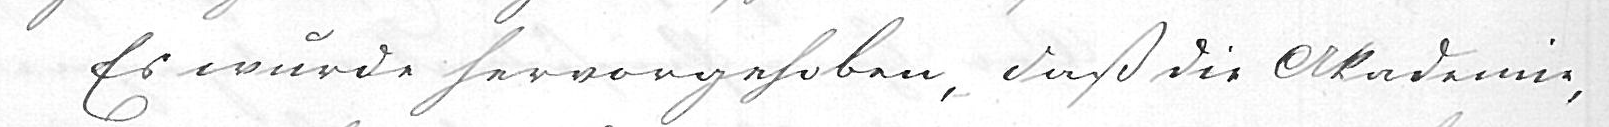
Es wurde hervorgehoben, daß die Akademie,
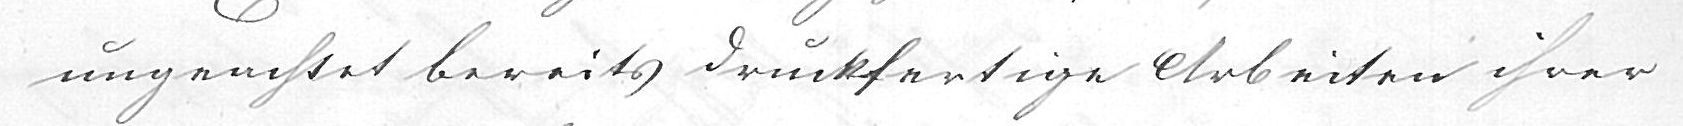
ungeachtet bereits druckfertige Arbeiten ihrer
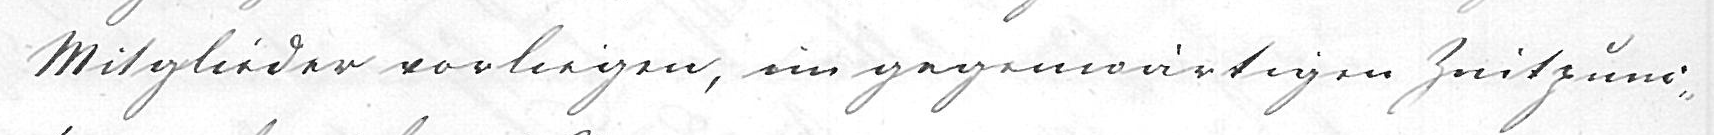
Mitglieder vorliegen, im gegenwärtigen Zeitpunc-
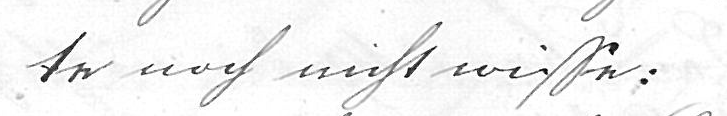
te noch nicht wisse:
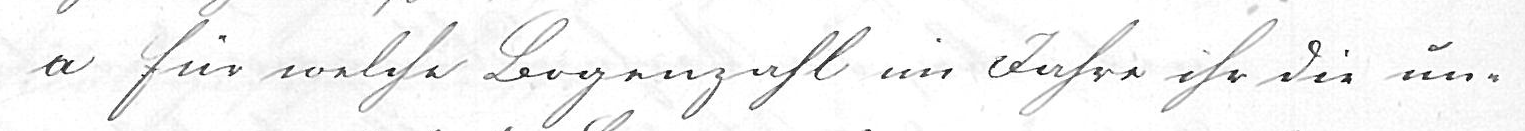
a. Für welche Bogenzahl im Jahre ihr die un-
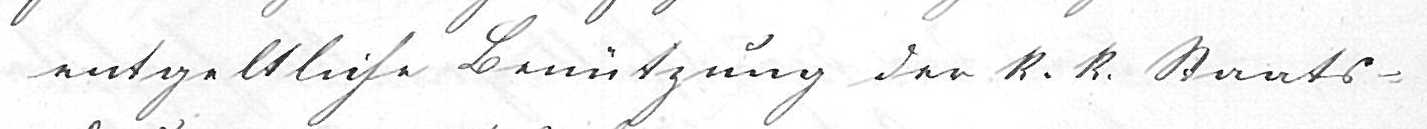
entgeltliche Benützung der k.k. Staats-
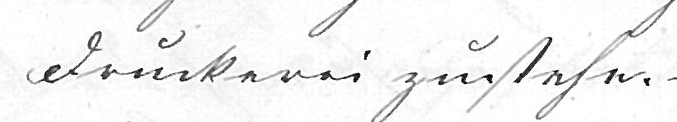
druckerei zustehe.
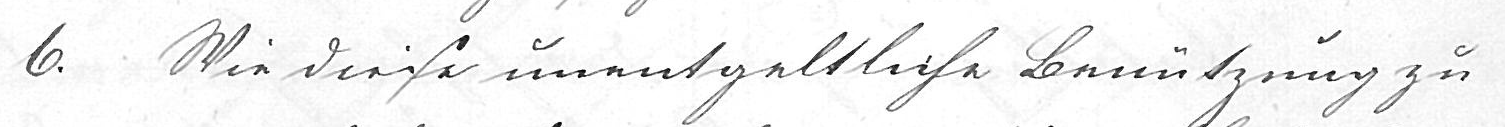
b. Wie diese unentgeltliche Benützung zu
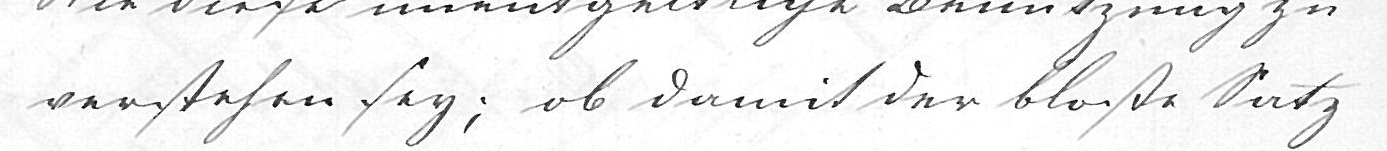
verstehen sey; ob damit der bloße Satz-
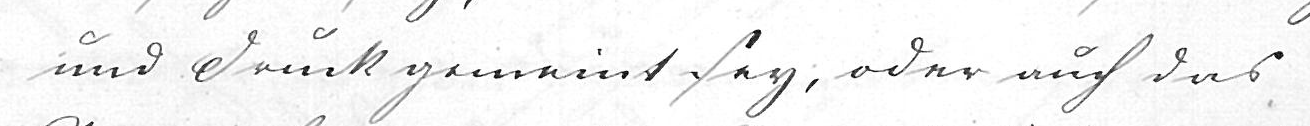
und Druck gemeint sey, oder auch das
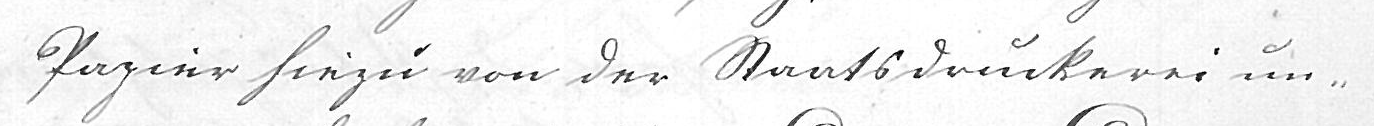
Papier hiezu von der Staatsdruckerei un-
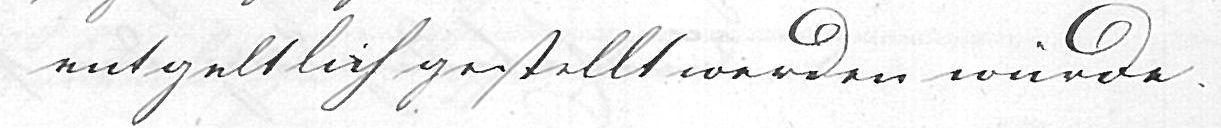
entgeltlich gestellt werden würde.
